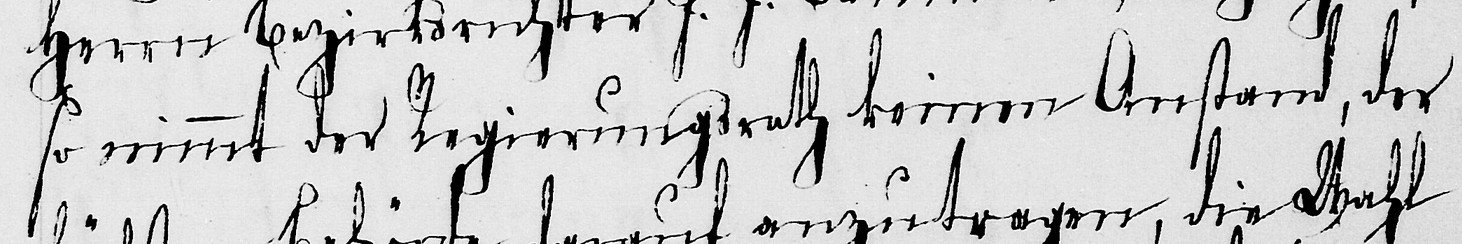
so nimmt der Regierungsrath keinen Anstand, der
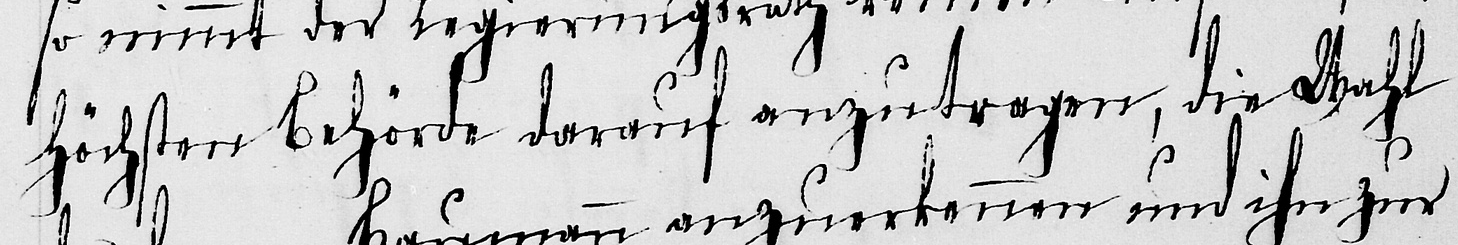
Höchsten Behörde darauf anzutragen, die Wahl
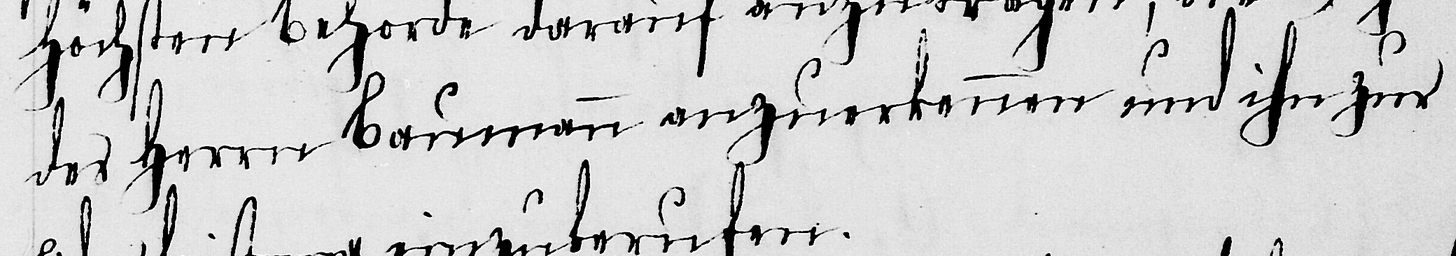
des Herrn Baumann anzuerkennen und ihn zur
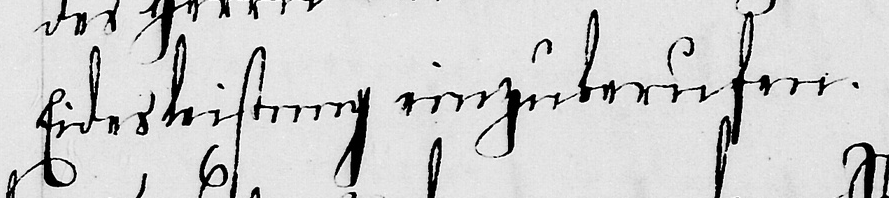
Eidesleistung einzuberufen.
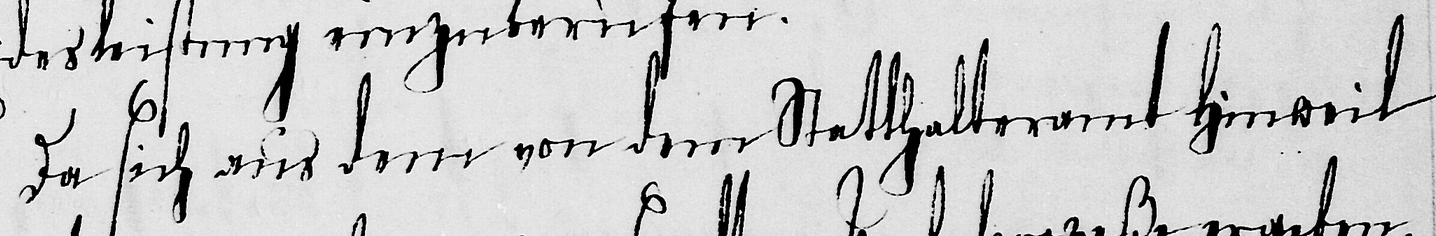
Da sich aus dem von dem Statthalteramt Hinweil
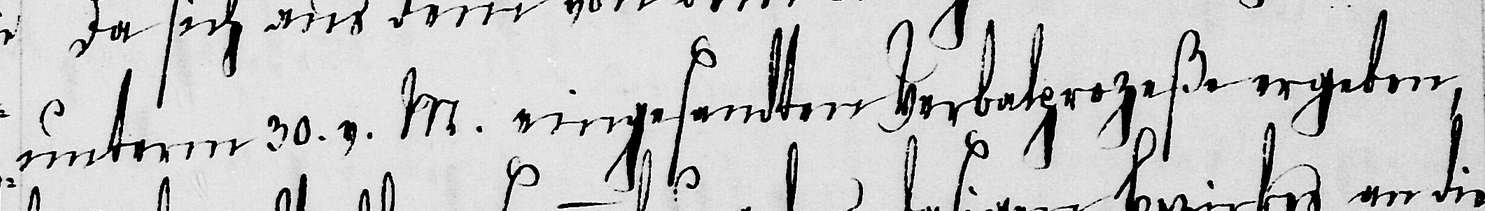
unterm 30. v. M. eingesandten Verbalprozeße ergeben,
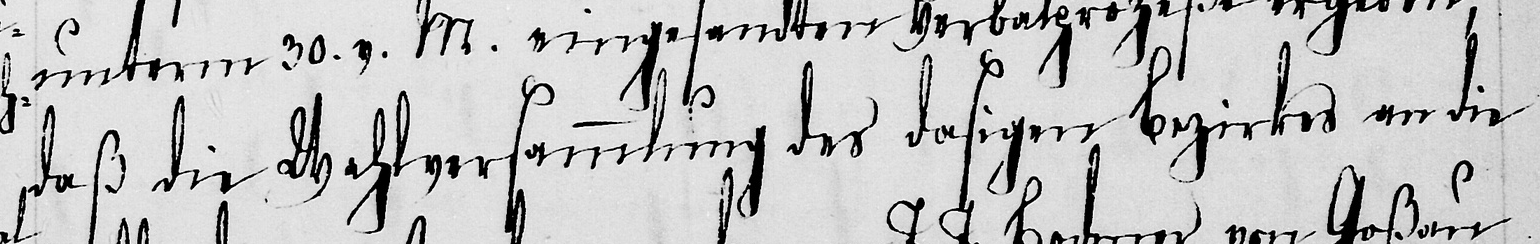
daß die Wahlversammlung des dasigen Bezirkes an die
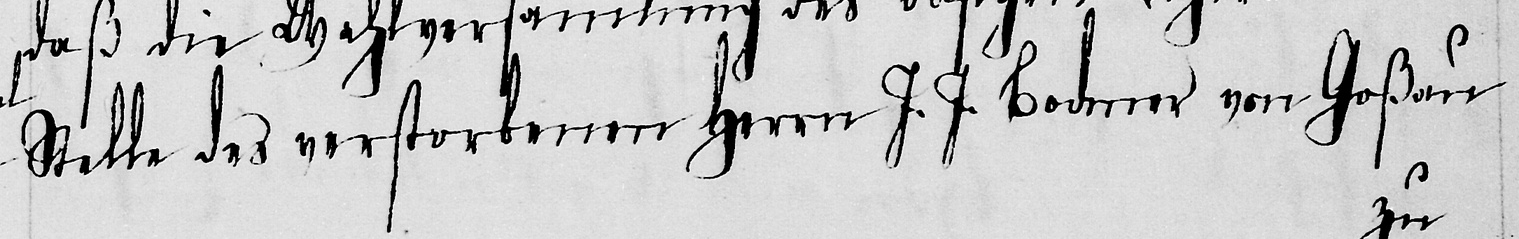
Stelle des verstorbenen Herrn. J. J. Bodmer von Goßau
